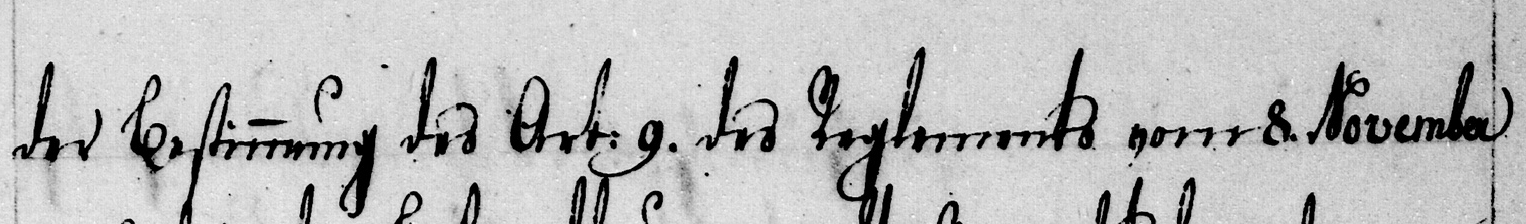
der Bestimmung des Art: 9. des Reglements vom 8. November
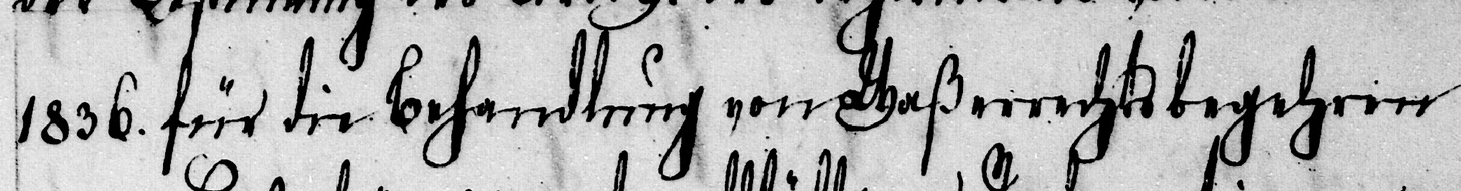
1836. für die Behandlung von Waßerrechtsbegehren
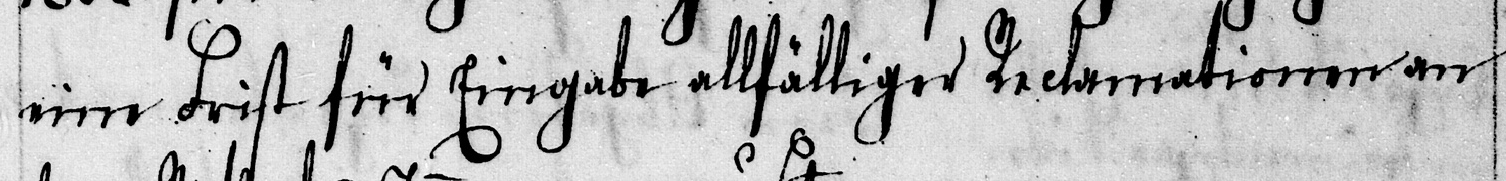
eine Frist für Eingabe allfälliger Reclamationen an
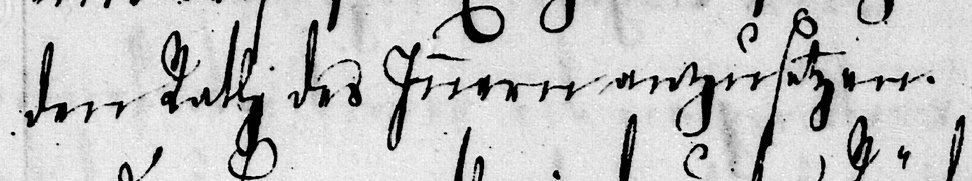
den Rath des Innern anzusetzen.
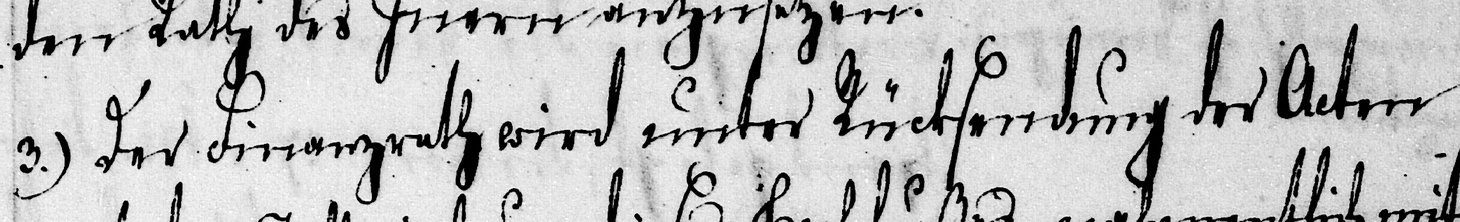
3.) Der Finanzrath wird unter Rücksendung der Acten
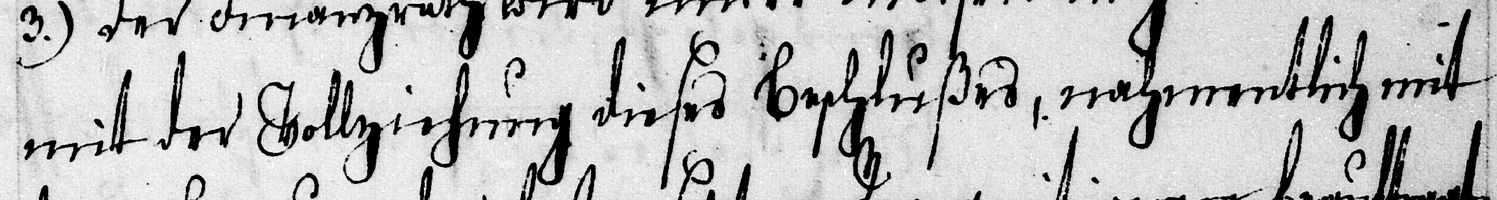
mit der Vollziehung dieses Beschlußes, nahmentlich mit
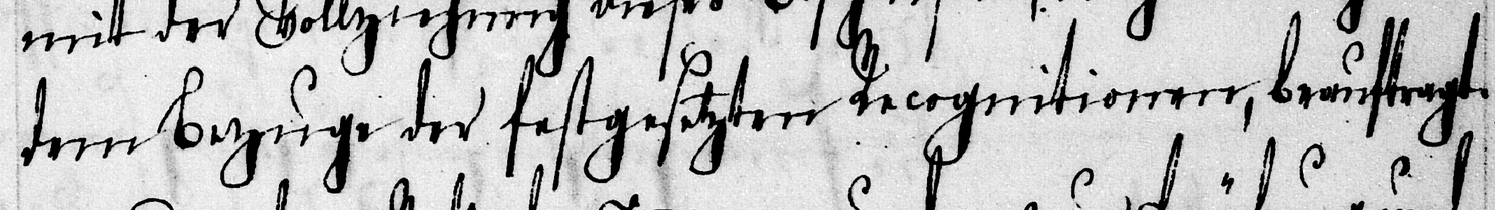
dem Bezuge der festgesetzten Recognitionen, beauftragt.
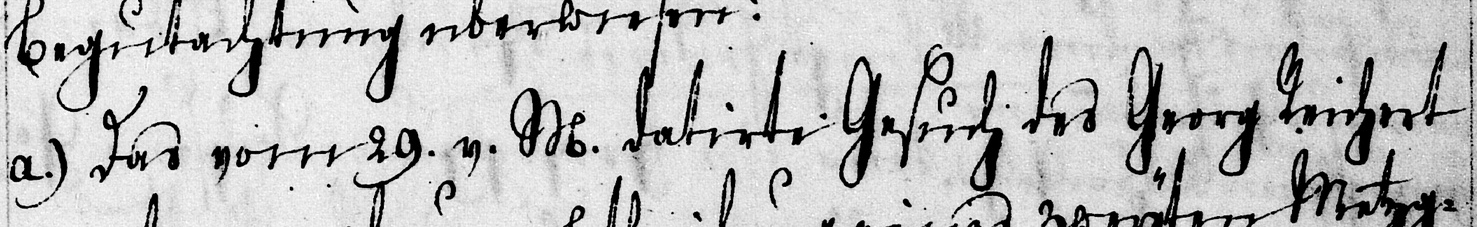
a.) Das vom 29. v. M. datirte Gesuch des Georg Reichert
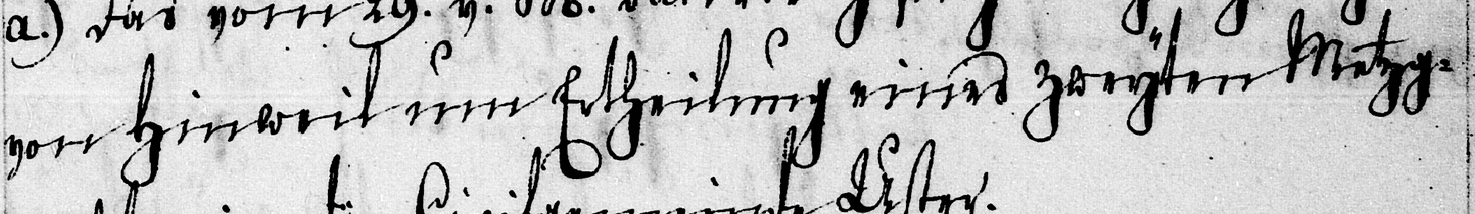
von Hinweil um Ertheilung eines zweyten Metzg¬
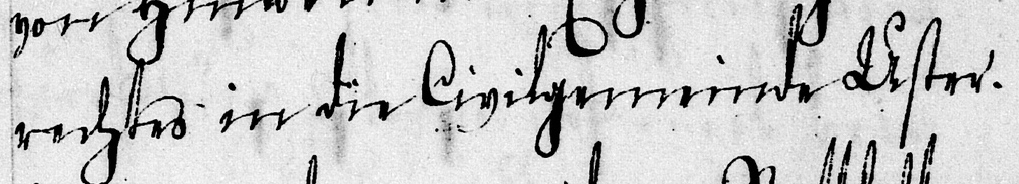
rechtes in die Civilgemeinde Uster.
